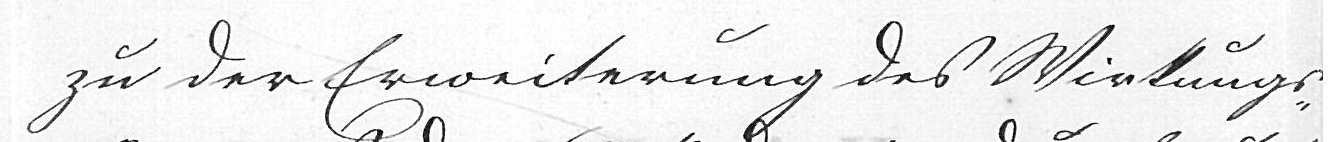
zu der Erweiterung des Wirkungs
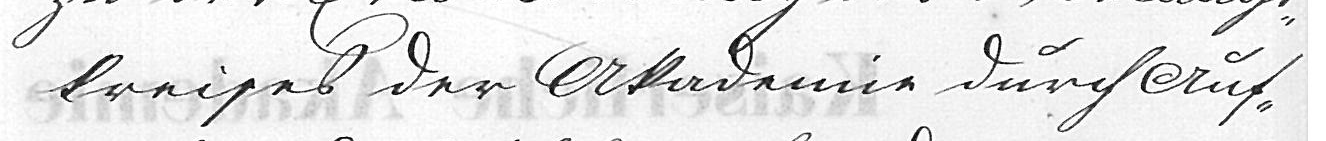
kreises der Akademie durch Auf-
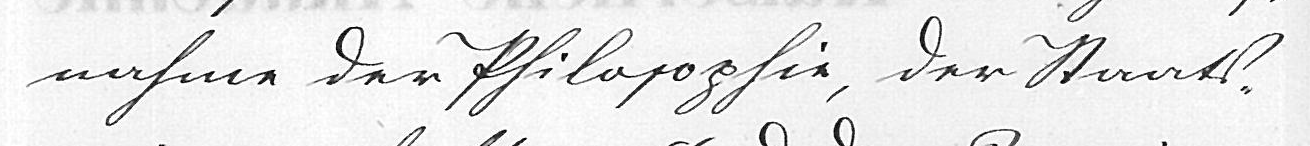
nahme der Philosophie, der Staats-
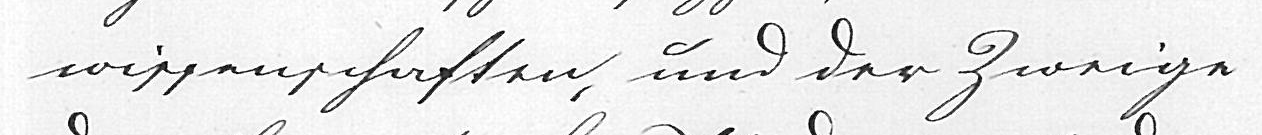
wissenschaften und der Zweige
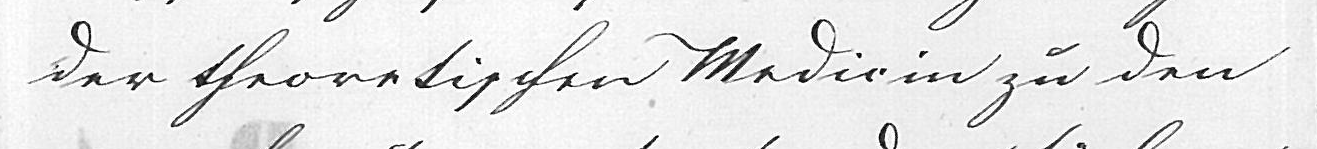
der theoretischen Medicin zu den
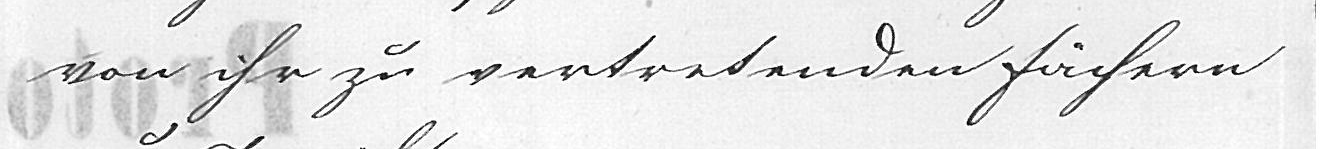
von ihr zu vertretenden Fächern
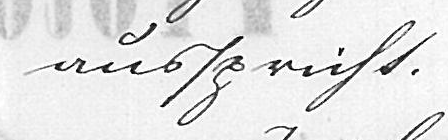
ausspricht.
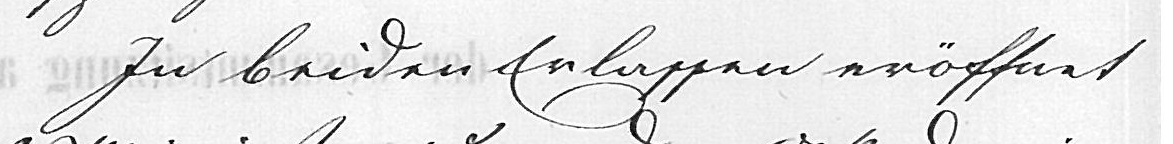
In beiden Erlassen eröffnet
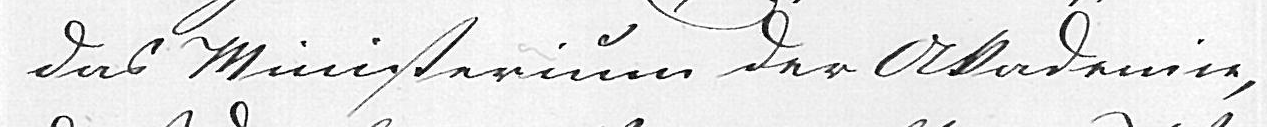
das Ministerium der Akademie,
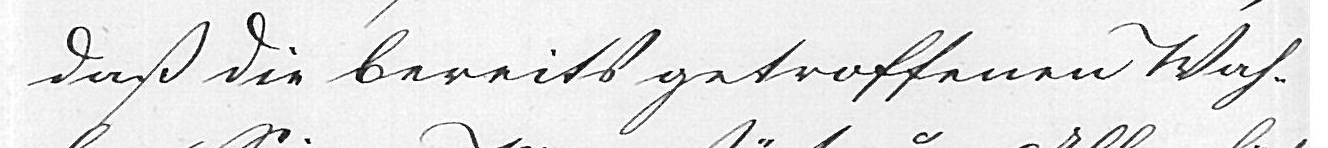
daß die bereits getroffenen Wah-
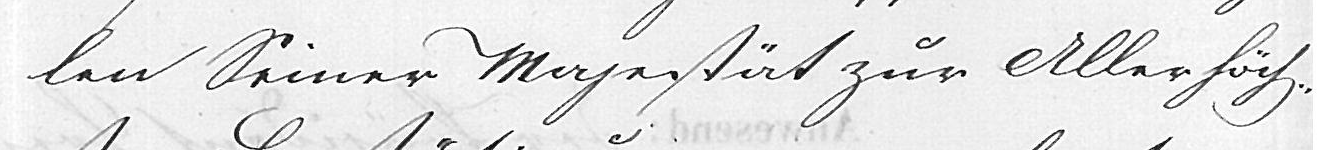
len Seiner Majestät zur Allerhöch-
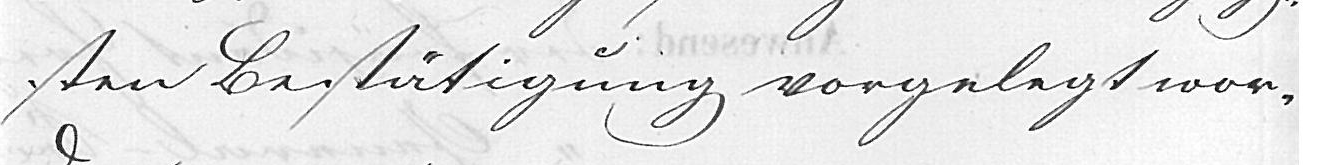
sten Bestätigung vorgelegt wor-
